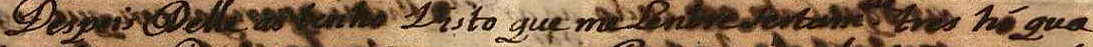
Despois Delle as tenho Visto que me Lembre sertam.te tres hó qua
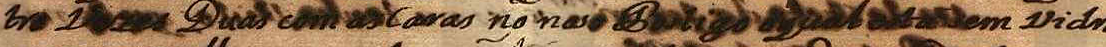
tro Vezes Duas com as Caras no noso Postigo a qual esta em vidra
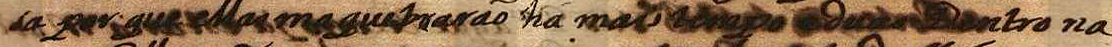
sa porque ellas mo quebraraõ há mais tempo e duas dentro na
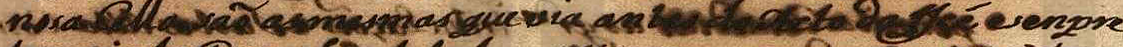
nosa Cella saõ as mesmas que via antes do Acto da feé, e sempre
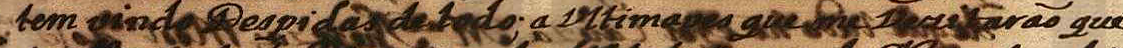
tem vindo Despidas de todo; a Ultima ves que me Vezitaraõ que
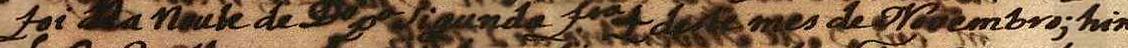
foi Na Noute de D.o p.a sigunda f.ra 4 deste mes de Novembro; hin
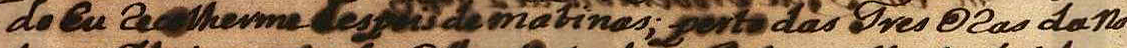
do Eu Recolherme despois de matinas; perto das Tres ORas da Noi
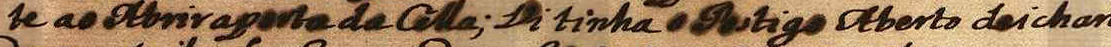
te ao Abrir a porta da Cella; Vi tinha o Postigo Aberto deichan
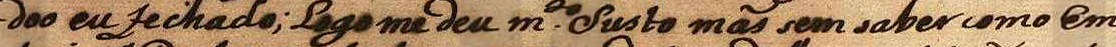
doo eu fechado; Logo me deu m.to Susto mãs sem saber como Em
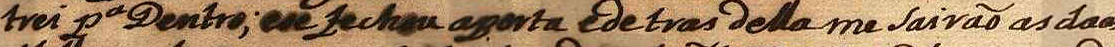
trei pa Dentro; e se fechou a porta e de tras della me sairaõ as duas
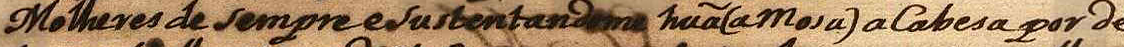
Molheres de sempre e sustentandome hūa (a Mosa) a Cabesa por de
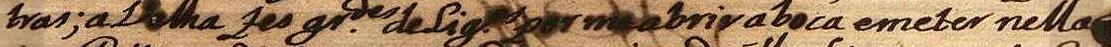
tras; a Velha fes gr.des deLig.as por me abrir a boca e meter nella
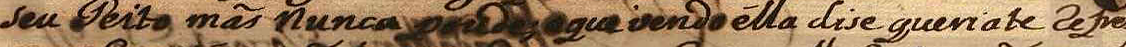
seu Peito mãs nunca poude, o que vendo élla dise queria te Refres
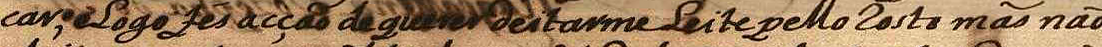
car, e Logo fés acçaõ de querer deitarme Leite pello Rosto mãs naõ
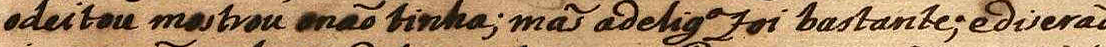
o deitou mostrou o naõ tinha; mãs a deliga foi bastante; e disseraõ
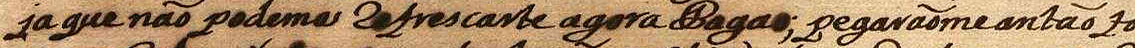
ja que naõ podemos Refrescarte agora Pagas; pegaraõme antaõ fo
